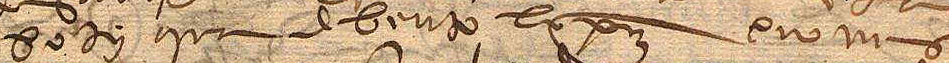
botyqua de bento lopez e no mes
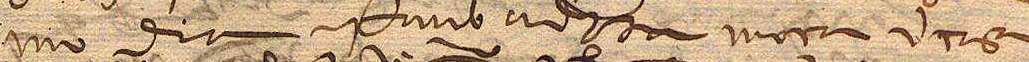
mo dia estando a dyta moça ē casa
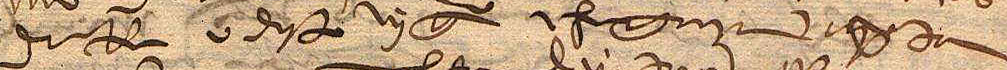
da Re o dyto vygro chegara a p̄ota
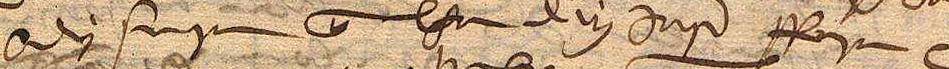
e dysera q̄ lha deytasē ffora e
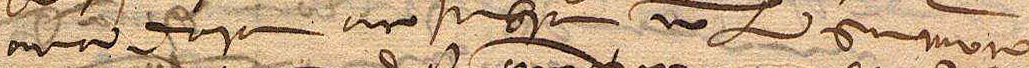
a mādara a coJmbra c̄o hū seu moço
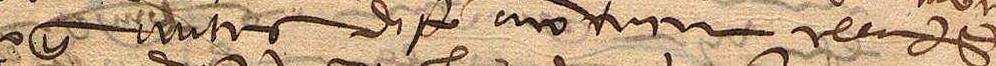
e q̄ antes disto ācoteçer ella tsa
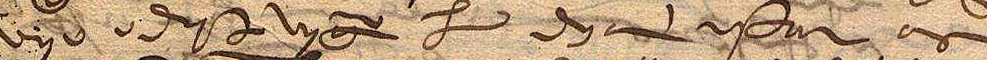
vyo o dyto vygro hū dya estar as
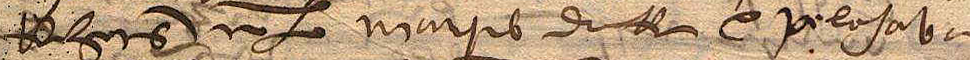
Rezões c̄o ho marjdo da Re e pelejavam
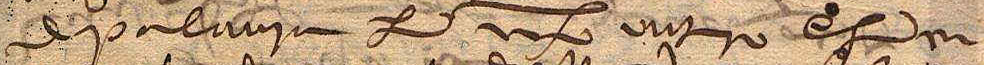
de palaura hū c̄o ho outro e hū cu
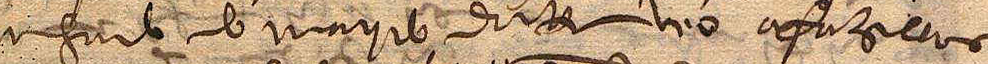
nhado do marjdo da Re veo a fazellos
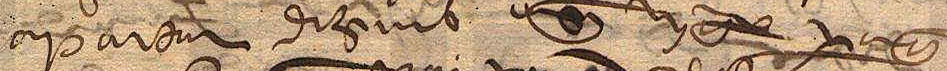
apartar dizendo o s̄r vygro ꝑa q̄
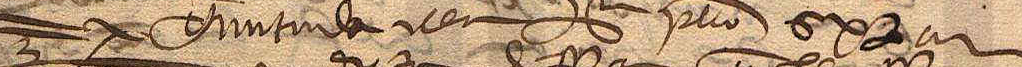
item ꝑguntada ella tsa p̄llo sexto ar
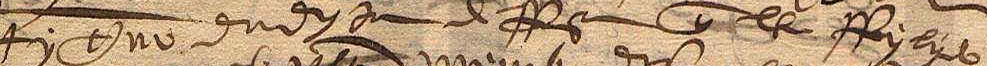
tyguo da dyta deffesa q̄ lhe ffoy lydo
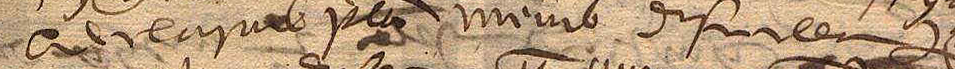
e declarado p̄llo meudo dise ella tsa
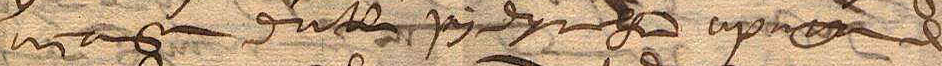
a casa da Re pydyalhe a paga de
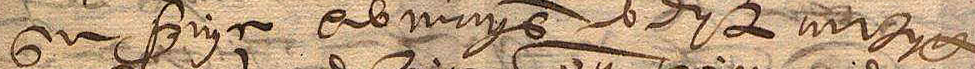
seu ꞩuyço e do mays do dyto artygo
